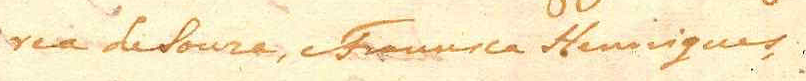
rea de Souza, e Fransisca Henrriques,
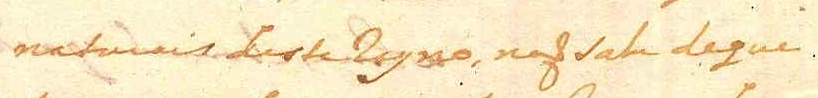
naturais deste Reyno, naõ sabe de que
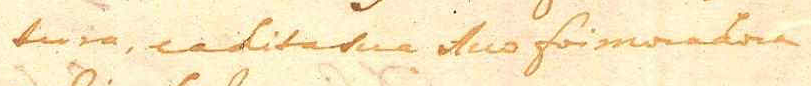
terra, e a dita sua Auo foi moradora
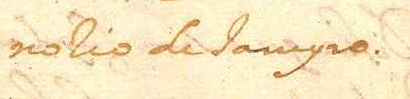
no Rio de Ianeyro.
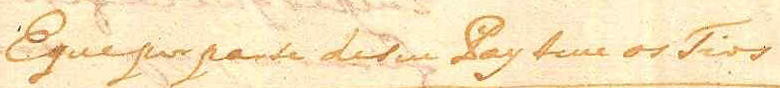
E que por parte de seu Pay teue os Tios
